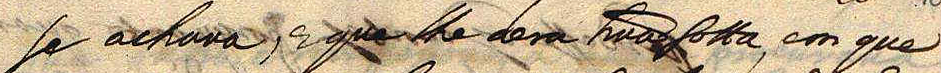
se achaua, E que lhe dera hūa sotta, em que
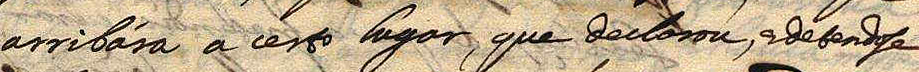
arribára a certo lugar, que declarou, E detendose
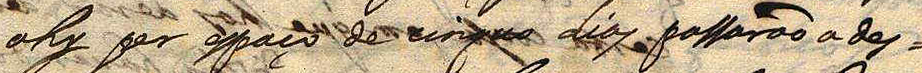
ahy per espaço de cinquo dias passaraõ a des
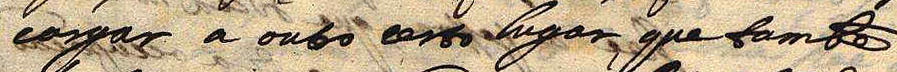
cargar a outro certo lugar, que tambē
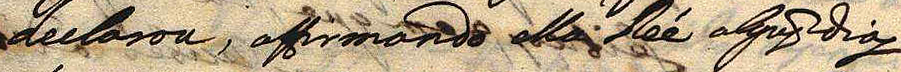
declarou, affirmando ella Reé algūs dias
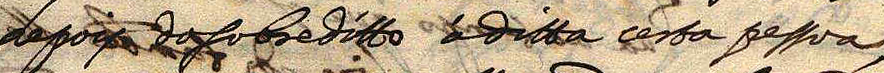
depois do sobreditto á ditta certa pessoa,
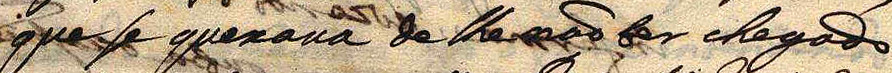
que se quexaua de lhe não ter chegado
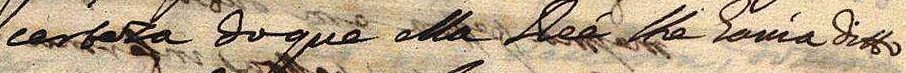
certeza do que ella Reé lhe hauia ditto
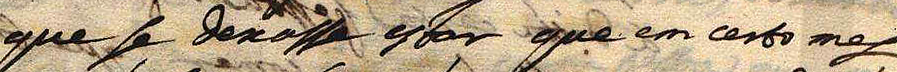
que se dexasse estar que em certo mes
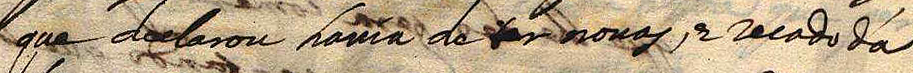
que declarou hauia de ter nouas, E recado da
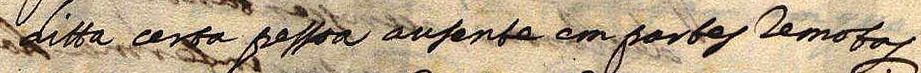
ditta certa pessoa ausente em partes remotas,
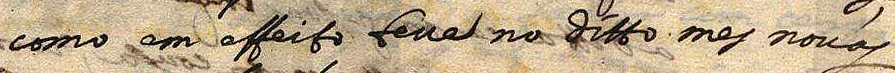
como em effeito teue no ditto mes nouas
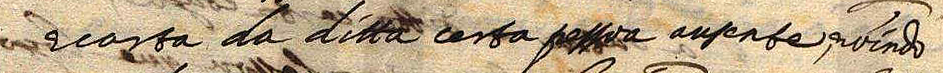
E carta da ditta certa pessoa ausente, E vindo
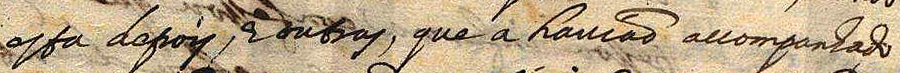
esta depois, E outras, que a hauião accompanhado
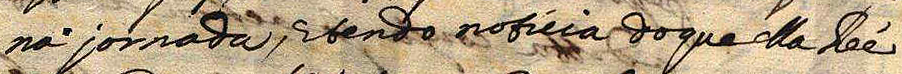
na jornada, E tendo noticia do que ella Reé
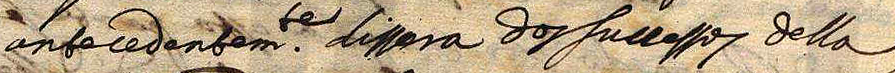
antecedentem.te dissera dos successos della
